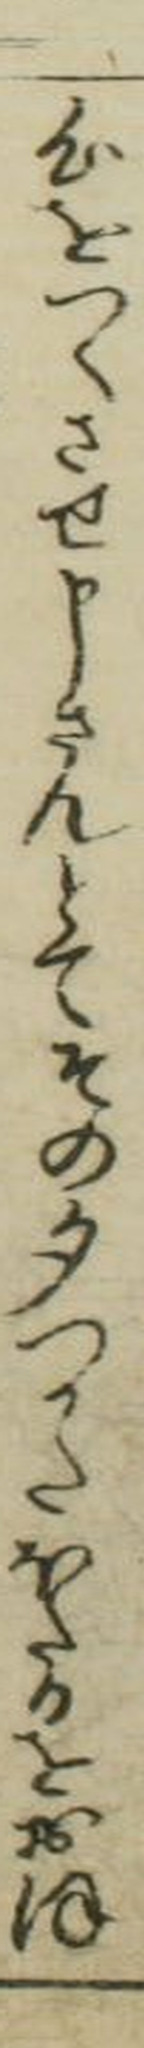心をつくさせ申さんとてその夕つかたほたるをおほ
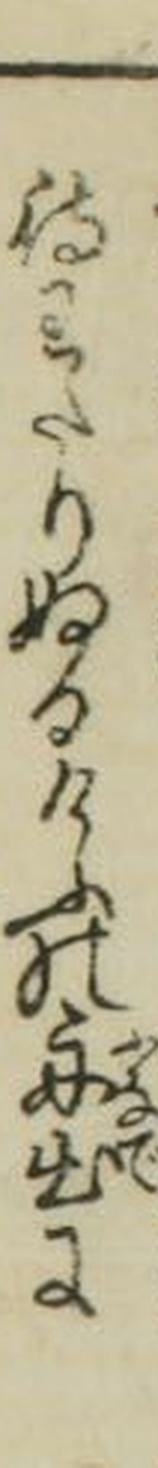待わたりぬるけふの舟出に
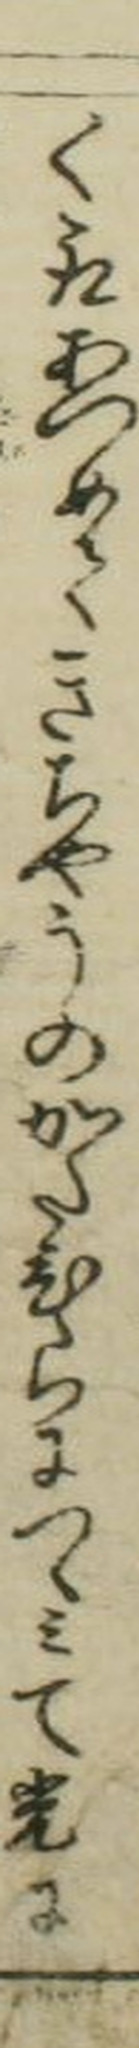く取あつめてきちやうのかたひらにつゝみて光に
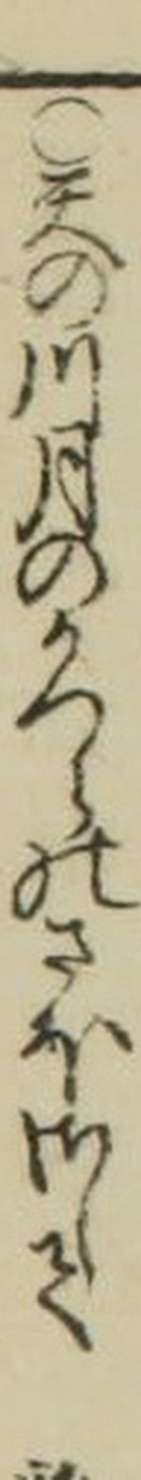○天の川月のかつらのさほさして雅景
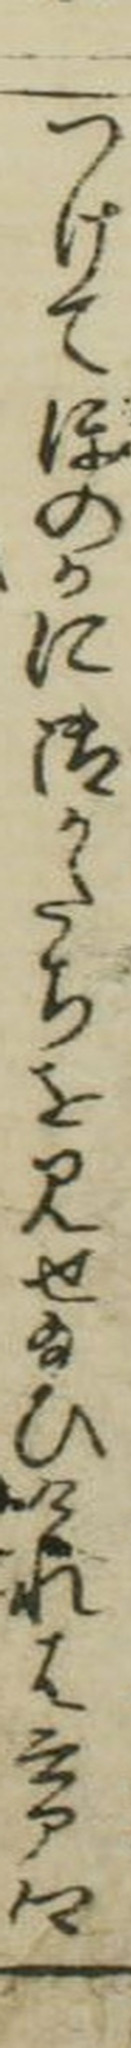つけてほのかに御かたちを見せ給ひけれは兵部卿
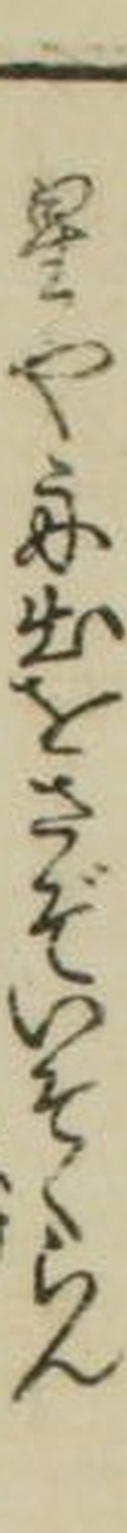星や舟出をさぞいそくらん
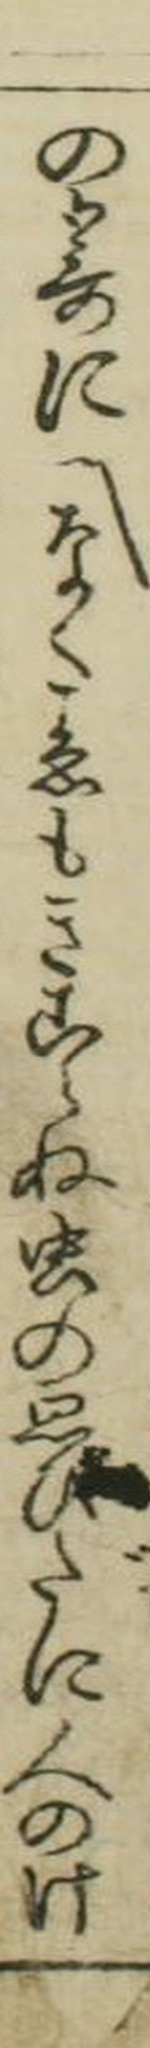の御哥に〽なくこゑもきこえぬ虫の思ひだに人のけ
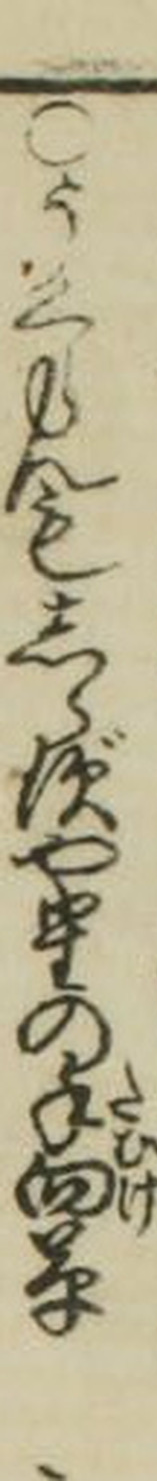○うく事もしらずや星の手向草よみ人
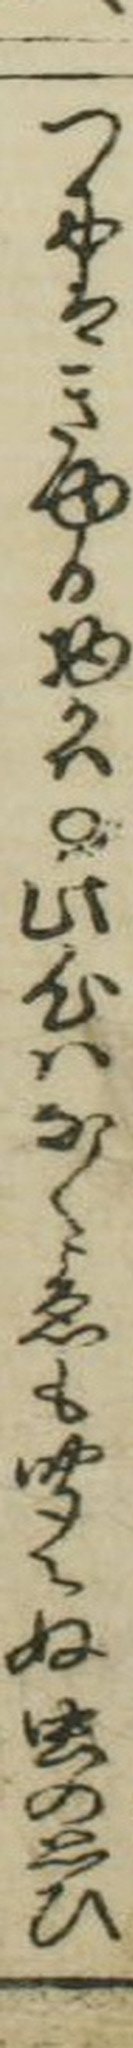つにはきゆる物かは○此心はなくこゑも聞えぬ虫の思ひ
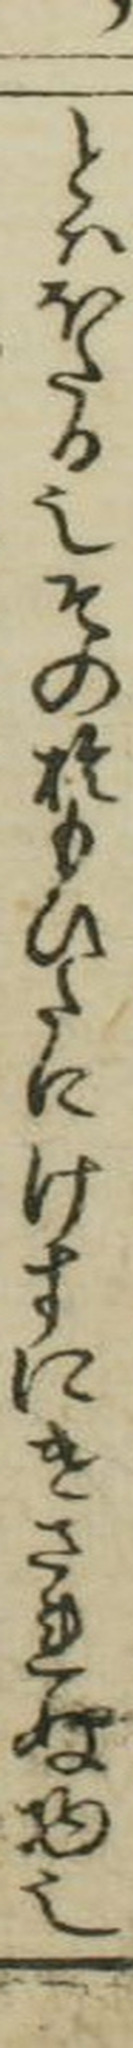とはほたる也そのおもひたにけすにけされぬ物也
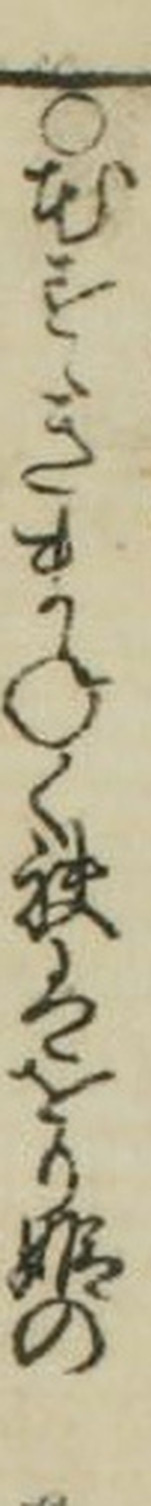○花すゝきまねく袂はをり姫の道晃
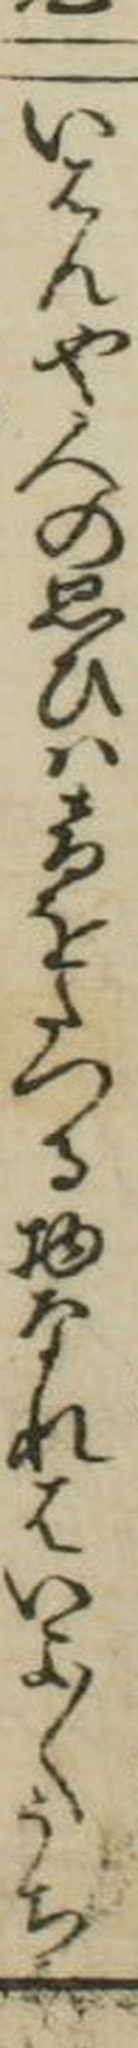いはんや人の思ひは音をたつる物なれはいよ〳〵うち
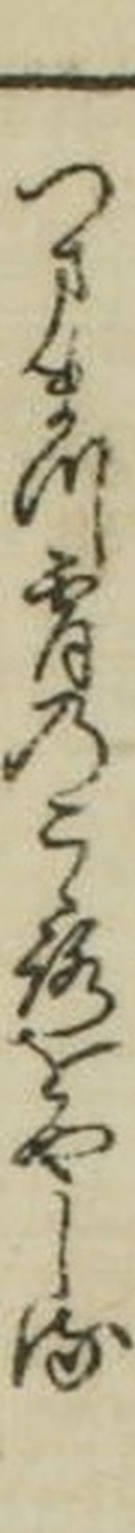つままつ宵のこゝろをやしる
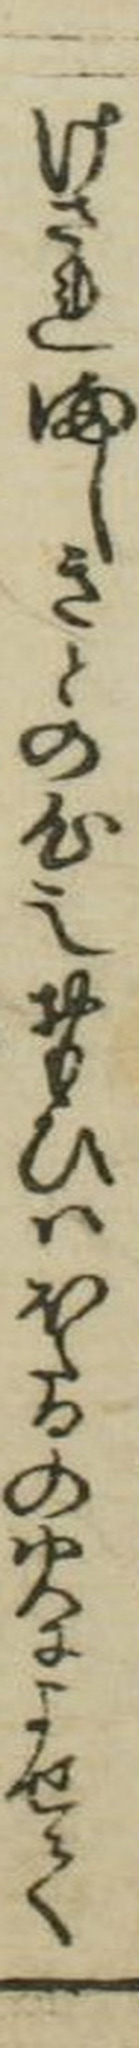けされましきとの心也おもひはほたるの火によせて
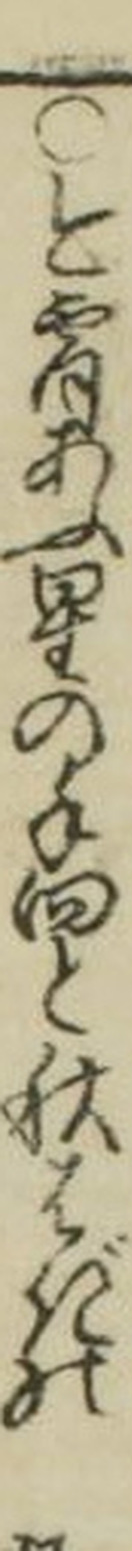○今宵あふ星の手向と秋はぎの雅景
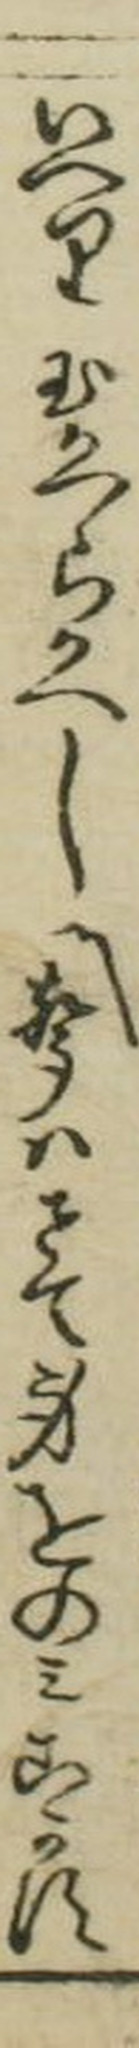いへり玉かつらかへし〽声はせて身をのみこかす
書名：女源氏教訓鑑
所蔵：東京学芸大学附属図書館
